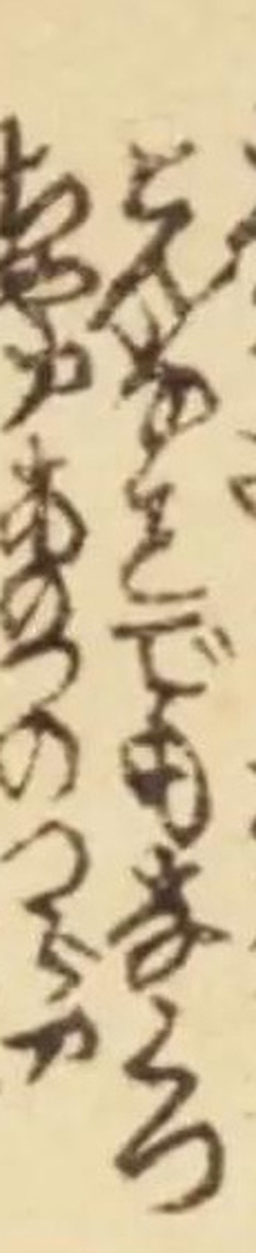ちやアあのつのつらア
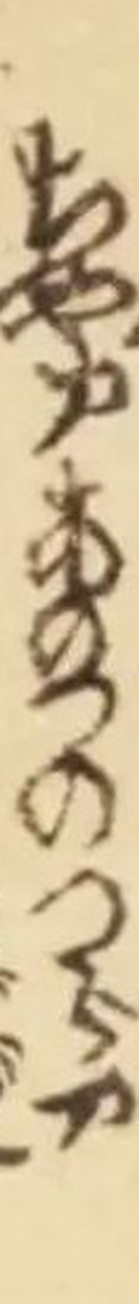ちやアあのつのつらア
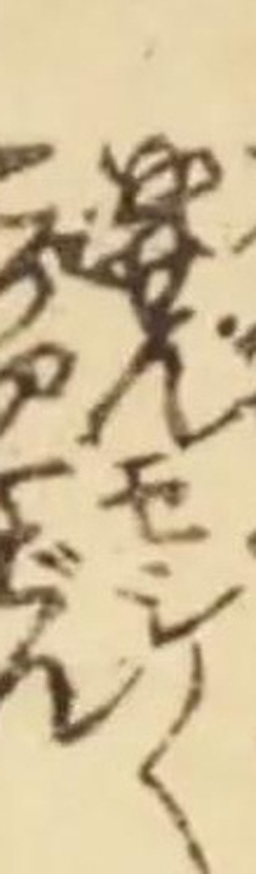こらア一ばん
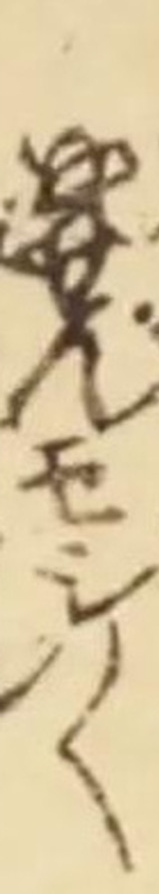やせんモシ〳〵
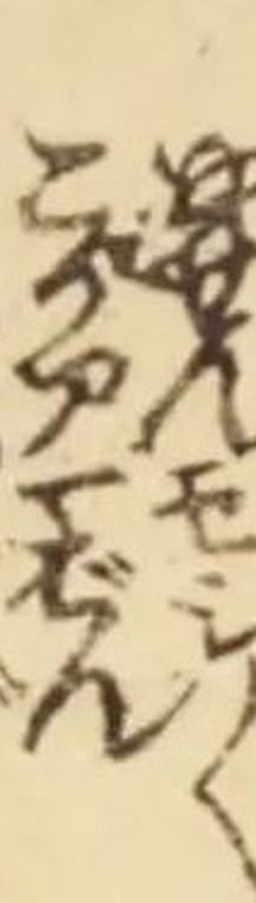こらア一ばん
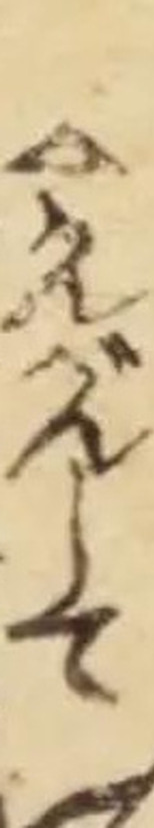△かんべんして
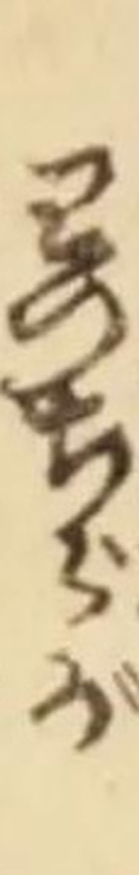わつちらが
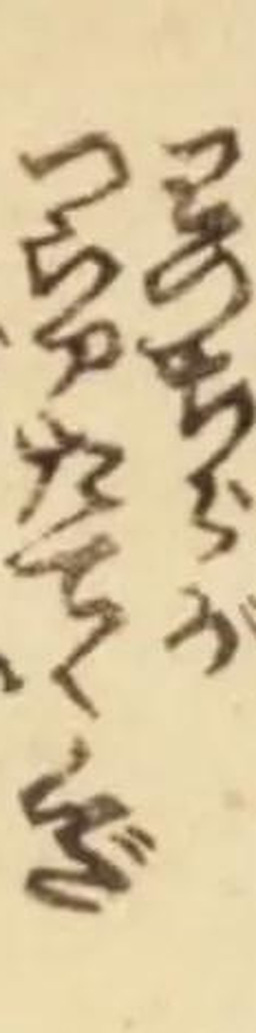つらアたてゝくだ
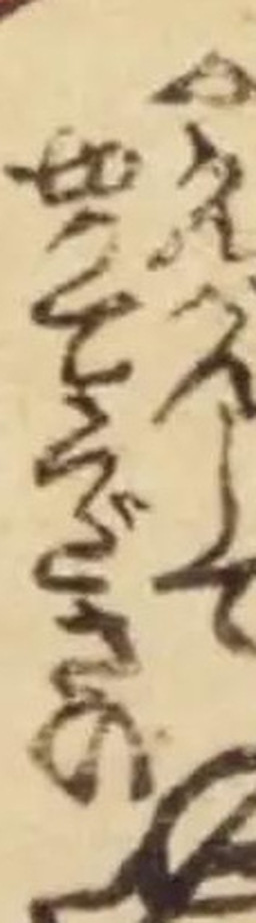やつてください
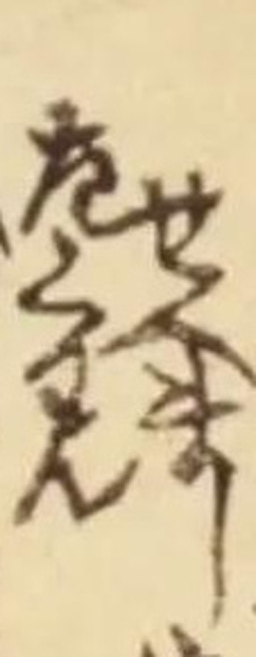たくわん
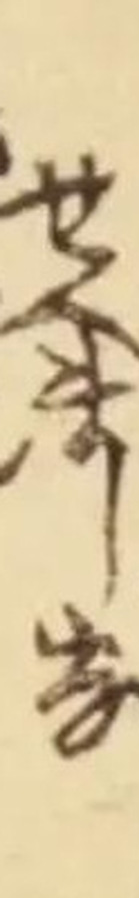せへましな
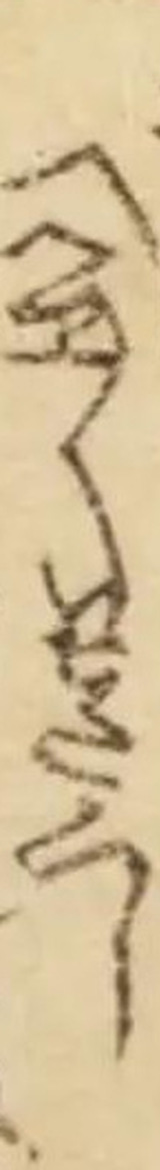「へエ〳〵わたくし
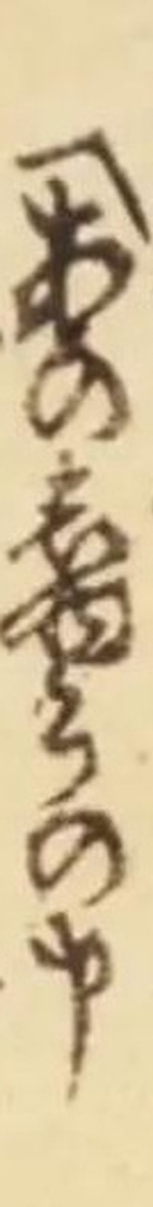「あのしやうの申
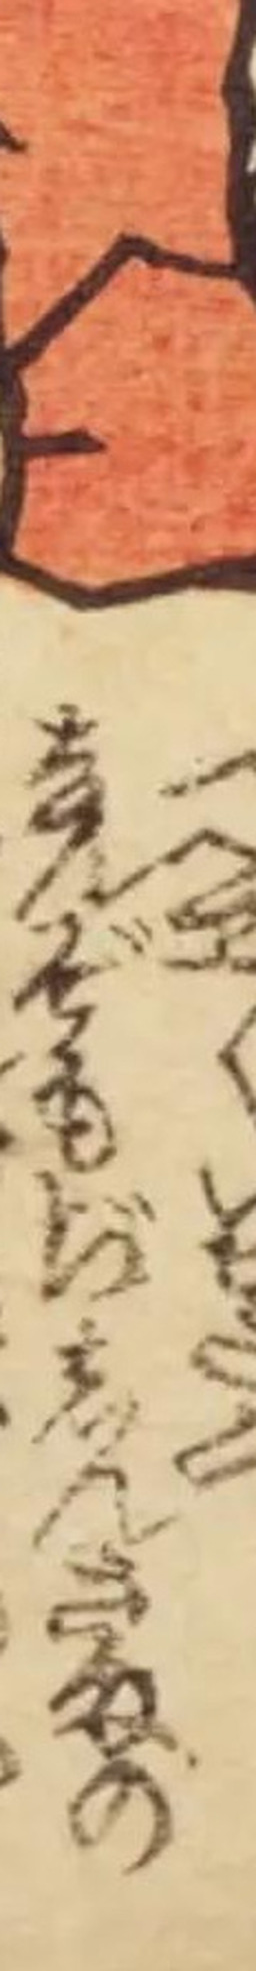なんぞもぢしんさまの
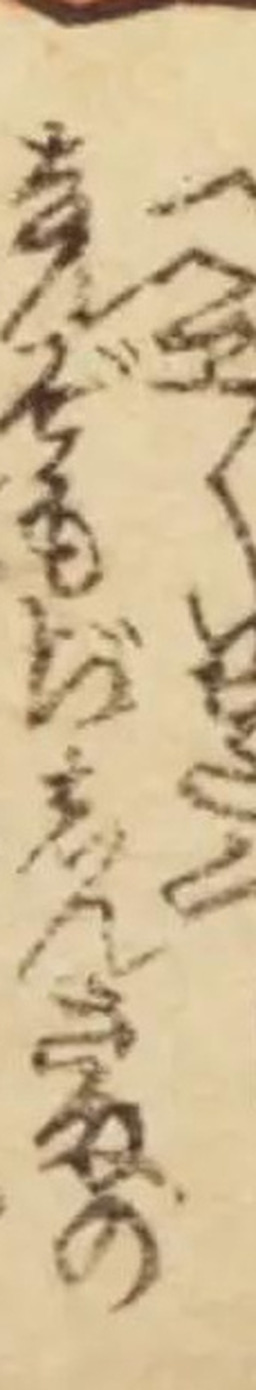なんぞもぢしんさまの
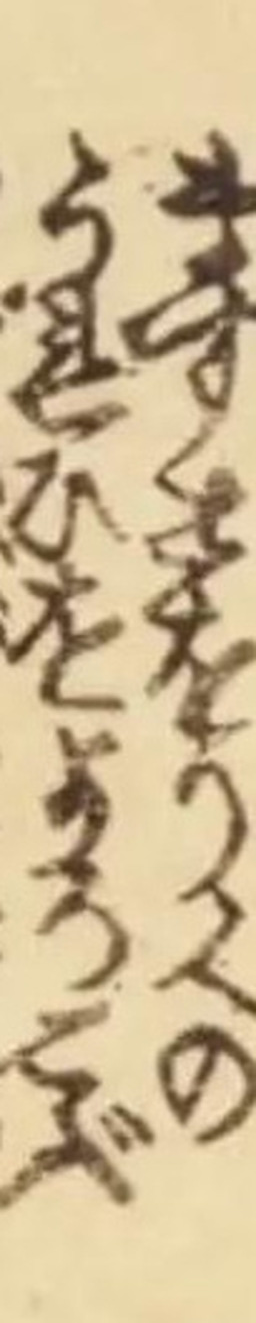うれひをよろこぶ
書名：生捕ました三度の大地震
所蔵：国立国会図書館 National Diet Library, JAPAN
